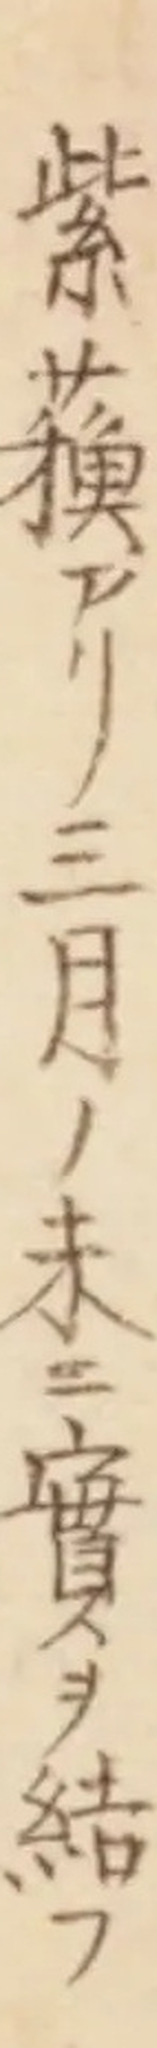紫蘇アリ三月ノ未ニ実ヲ結フ
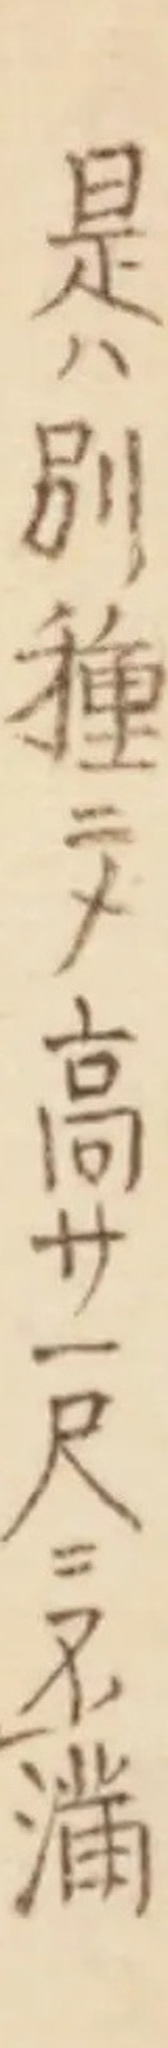是ハ別種ニシテ高サ一尺ニ不満
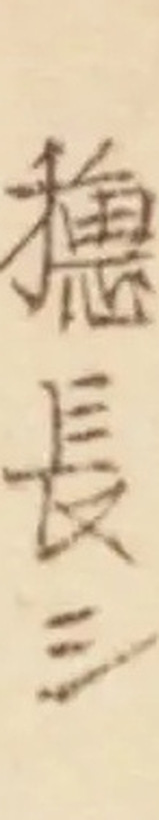穂長シ
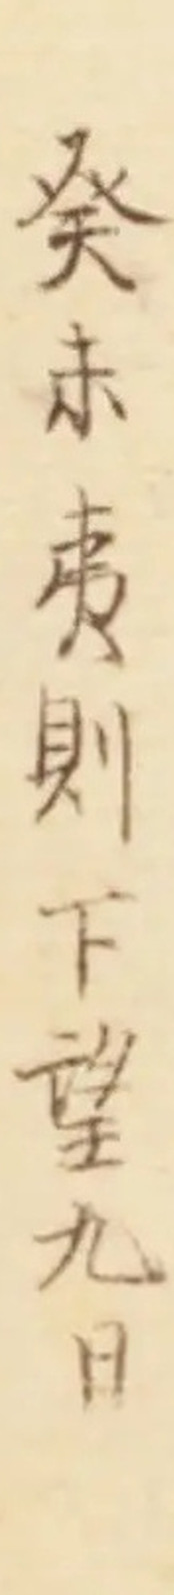癸未夷則下望九日
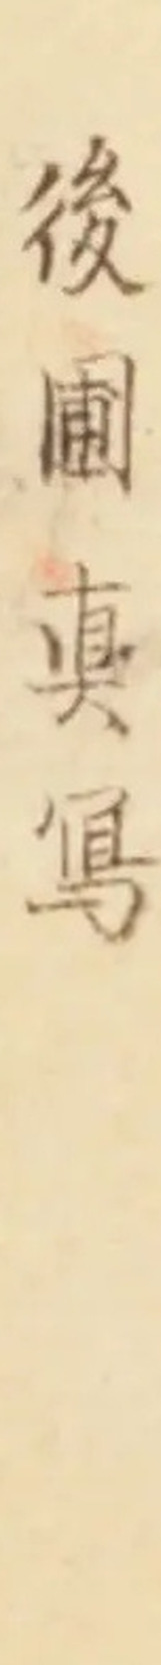後圃真写
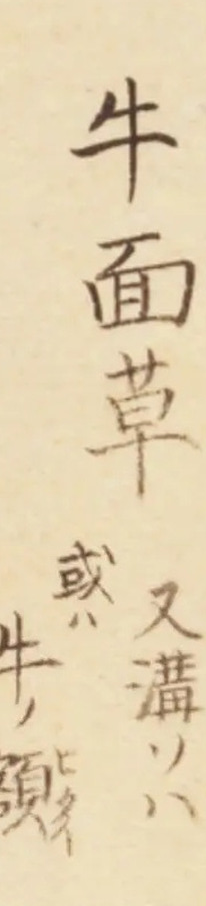牛面草又溝ソハ
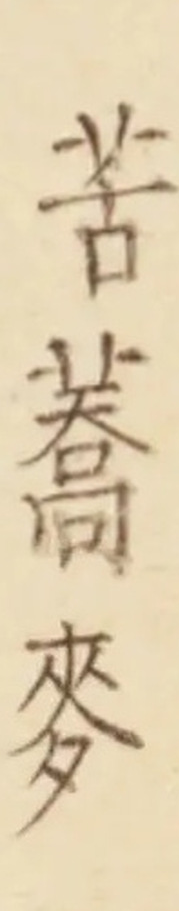苦蕎麦
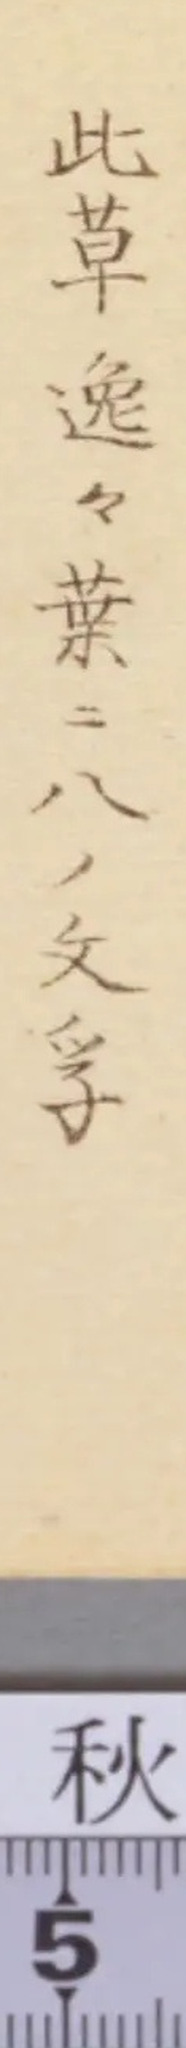此草逸々葉ニ八ノ文孚
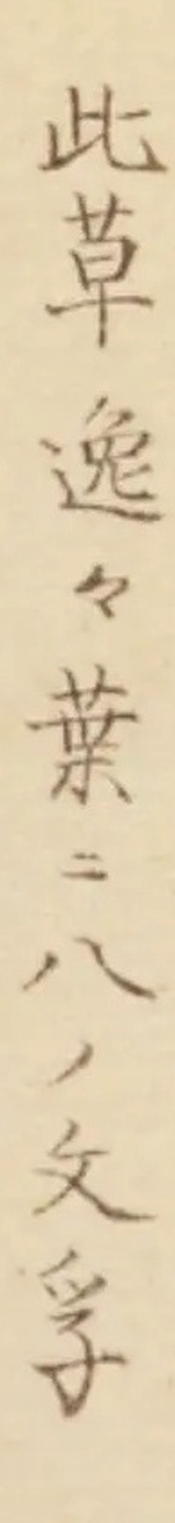此草逸々葉ニ八ノ文孚
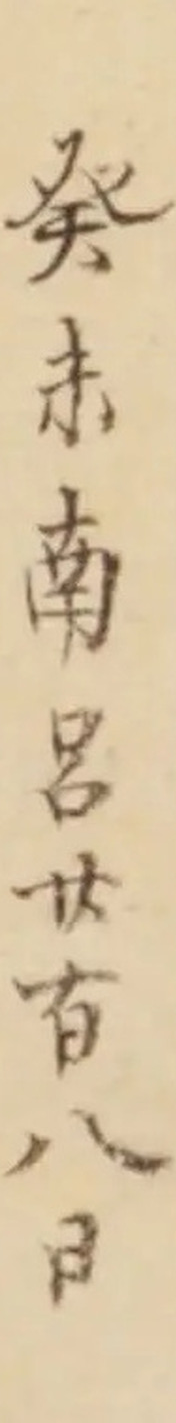癸未南呂廿有八日

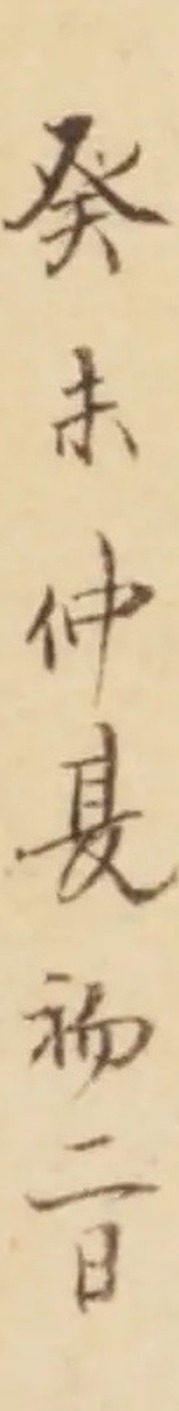癸未仲夏二日
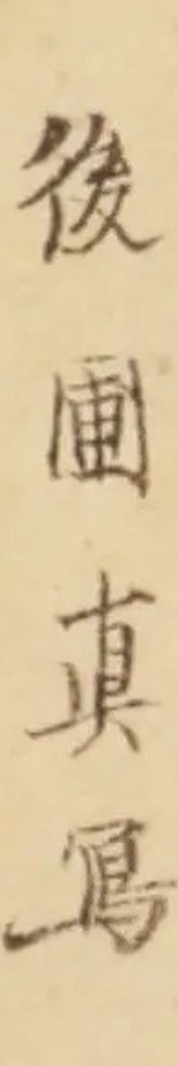後圃真写

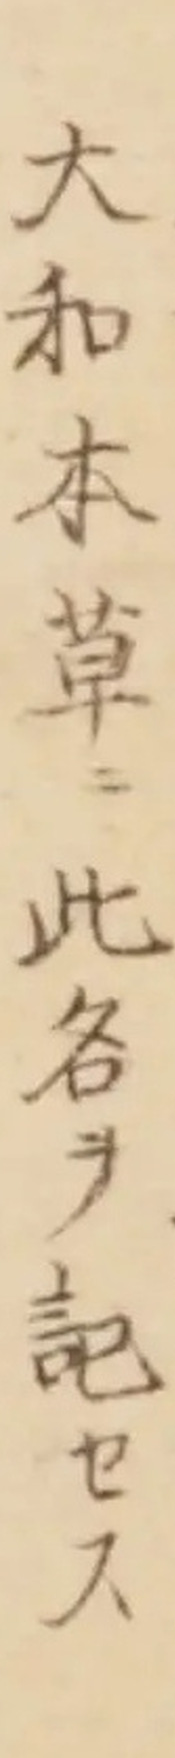大和本草此名ヲ記セス
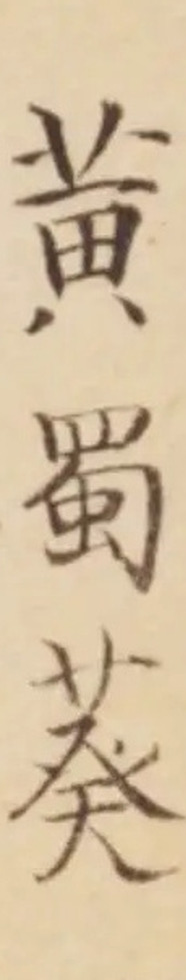黄蜀葵
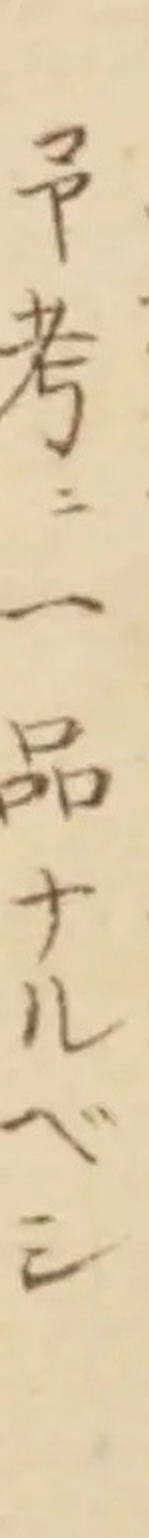予考一品ナルベシ
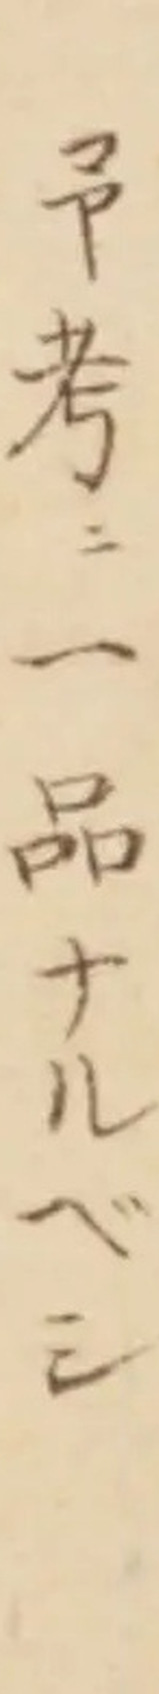予考一品ナルベシ
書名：梅園草木花譜秋之部. 2
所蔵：国立国会図書館 National Diet Library, JAPAN
